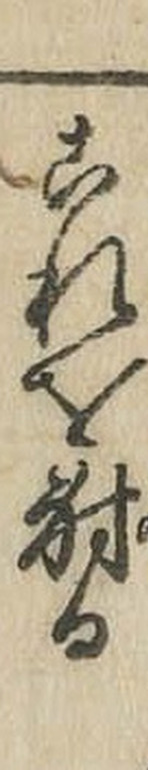これを射る
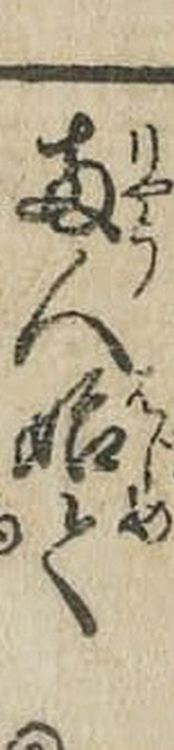両人始て

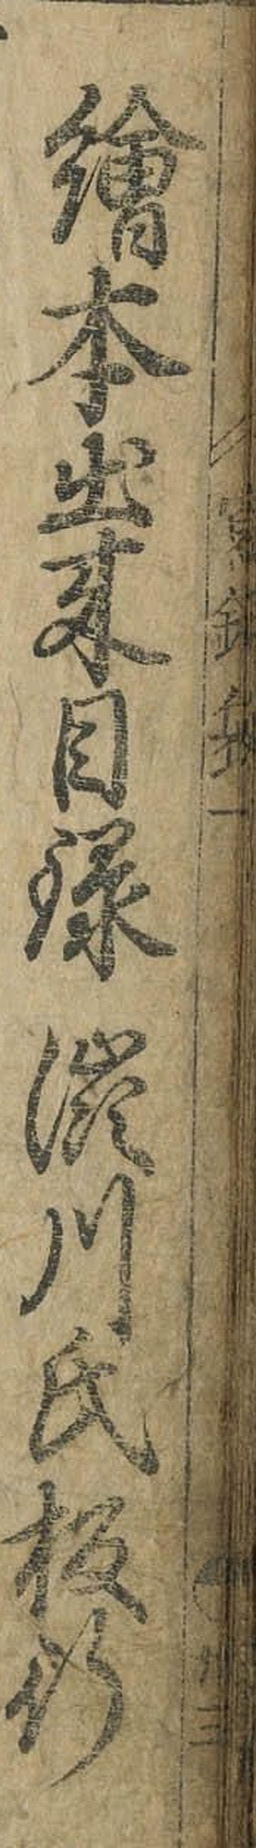絵本出来目録渋川氏板行
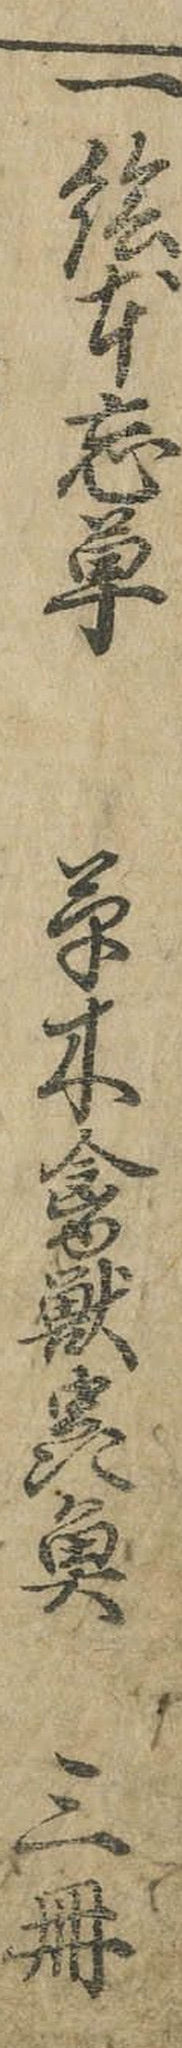一絵本忘草草本禽獣虫魚三冊
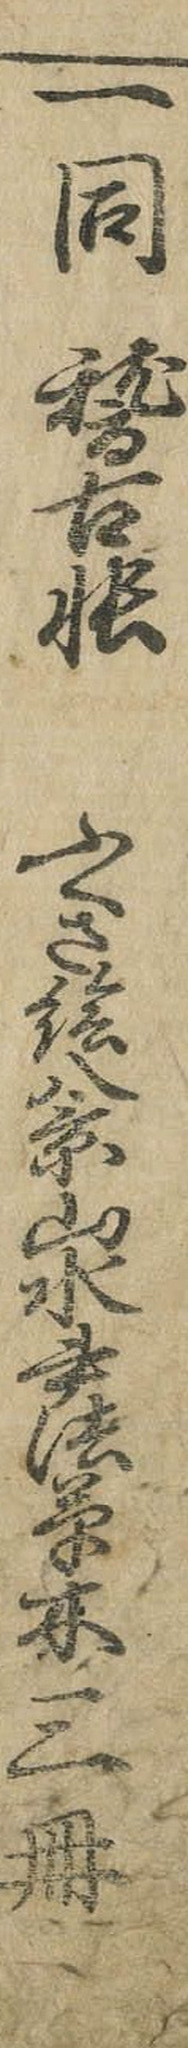一同稽古帖ふくさ絵八景山水書法草本三冊
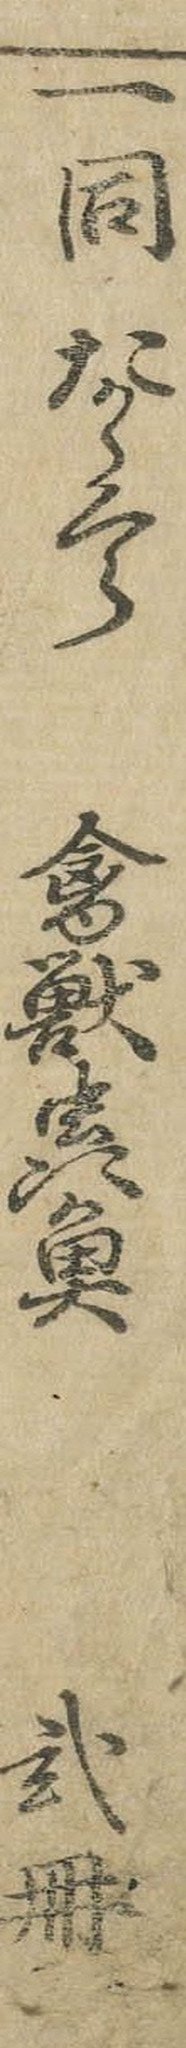一同たからくら禽獣虫魚弐冊
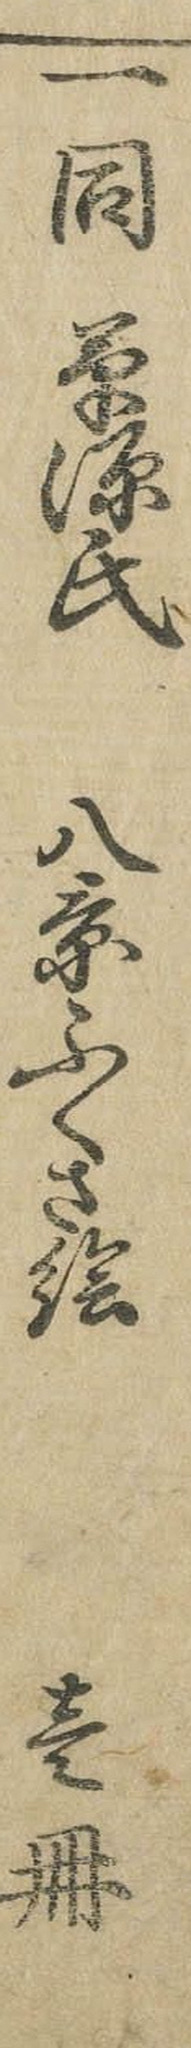一同草源氏八景ふくさ絵壱冊
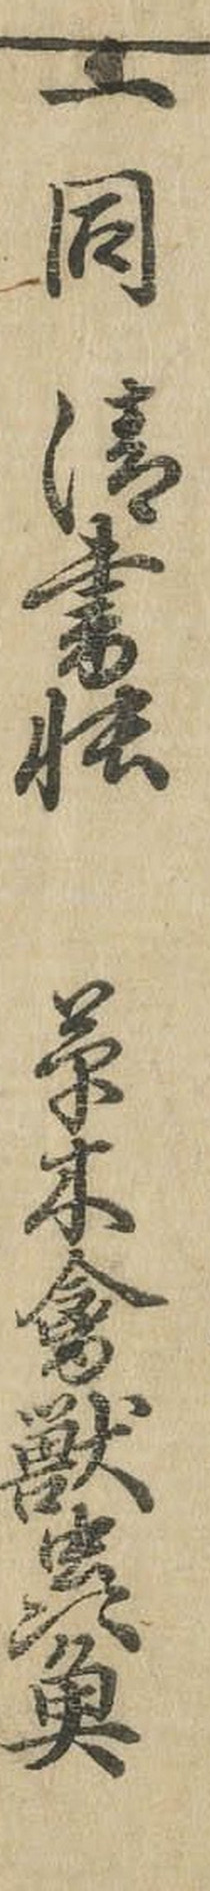一同清書帖草本禽獣虫魚四冊
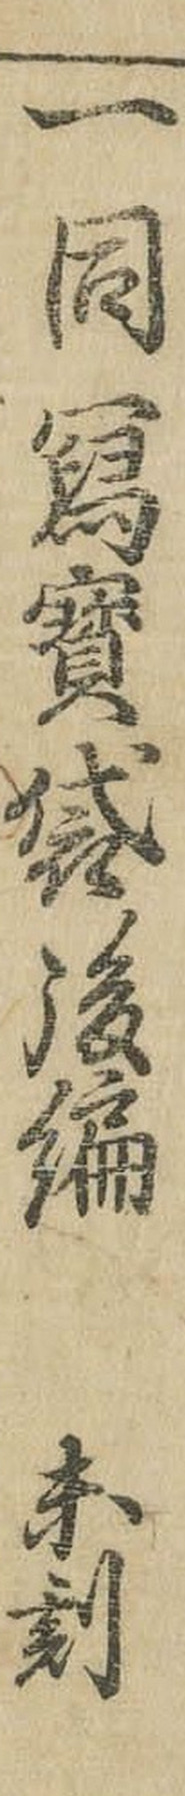一同写宝袋後編未刻
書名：絵本写宝袋 9巻 1之巻
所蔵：東京学芸大学教育コンテンツアーカイブ
